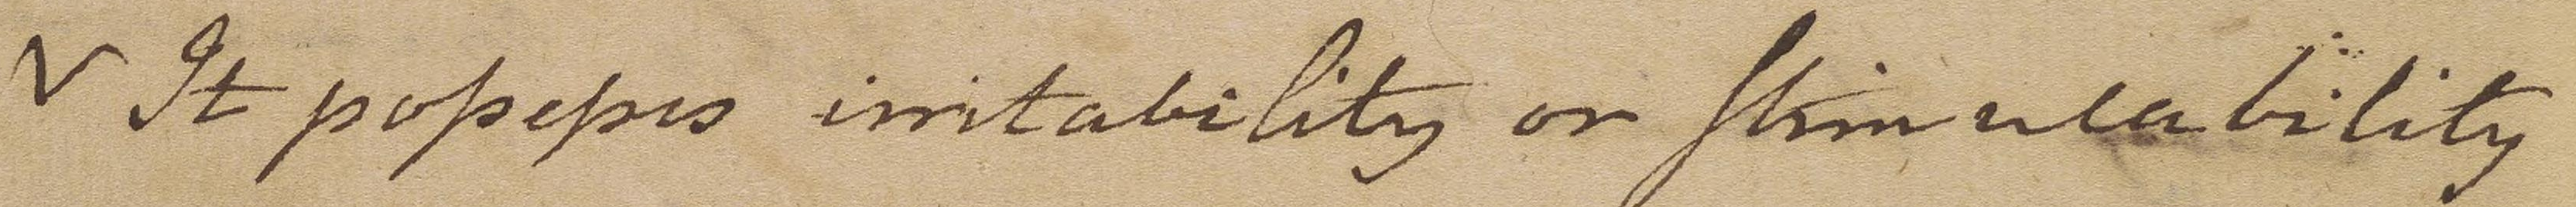V It possesses irritability or stimulability
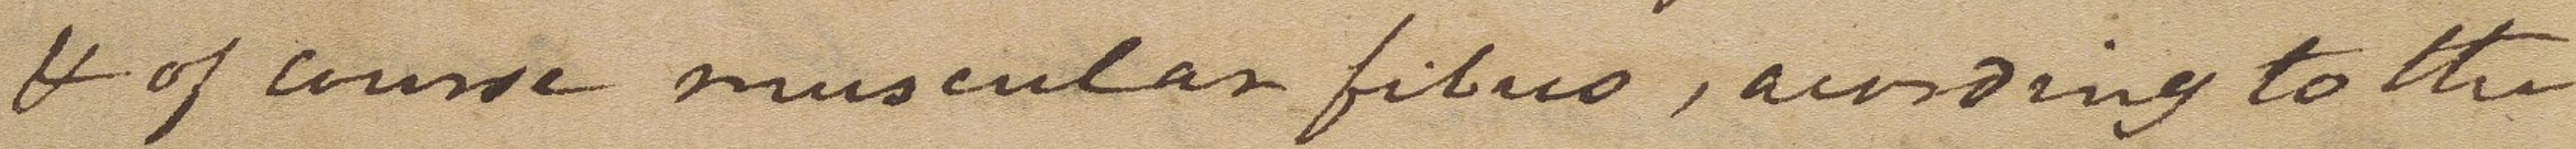& of course muscular fibres, according to the
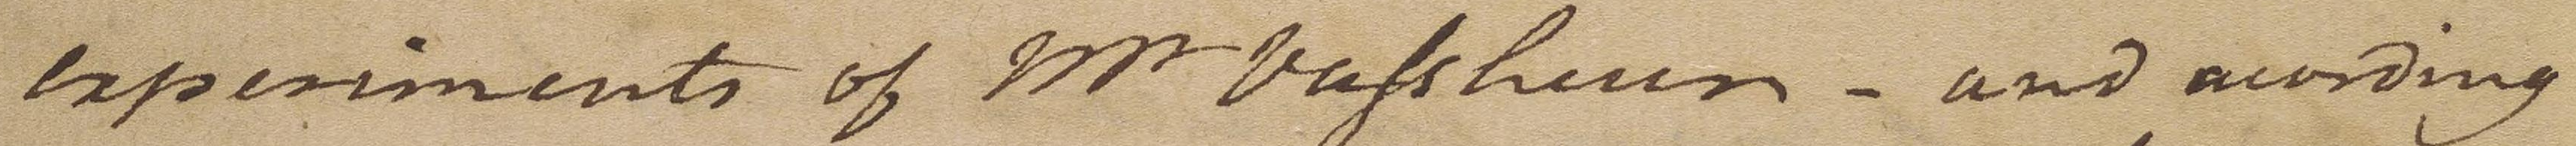experiments of M^r Vassheun- and according
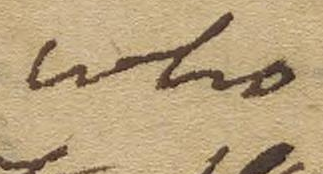who
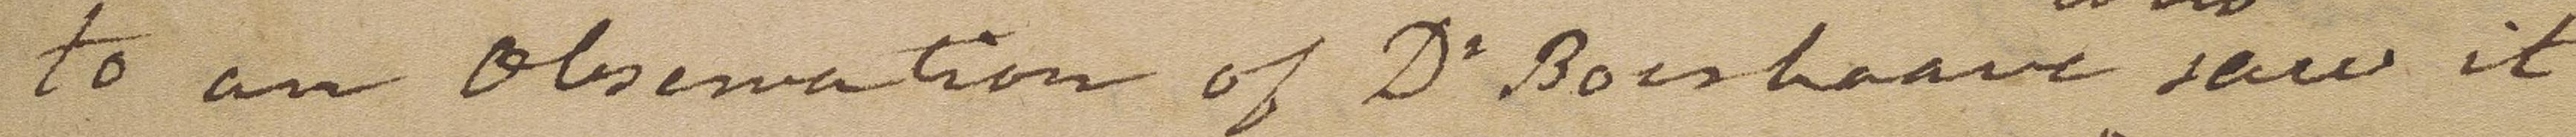to an Observation of D^r Boerhaave ^ saw it
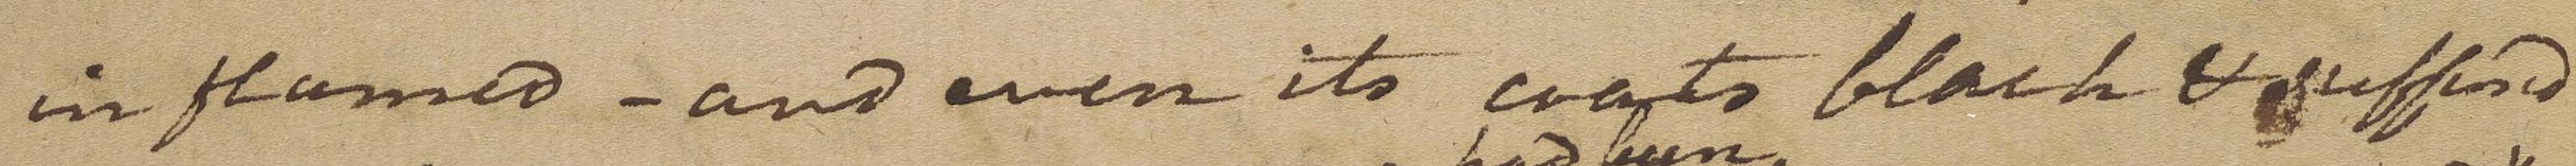inflamed, and even its coats black & suffused
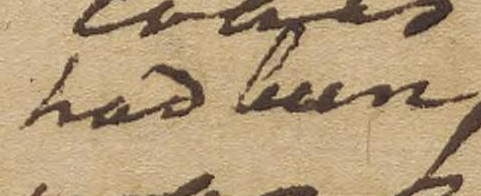had been
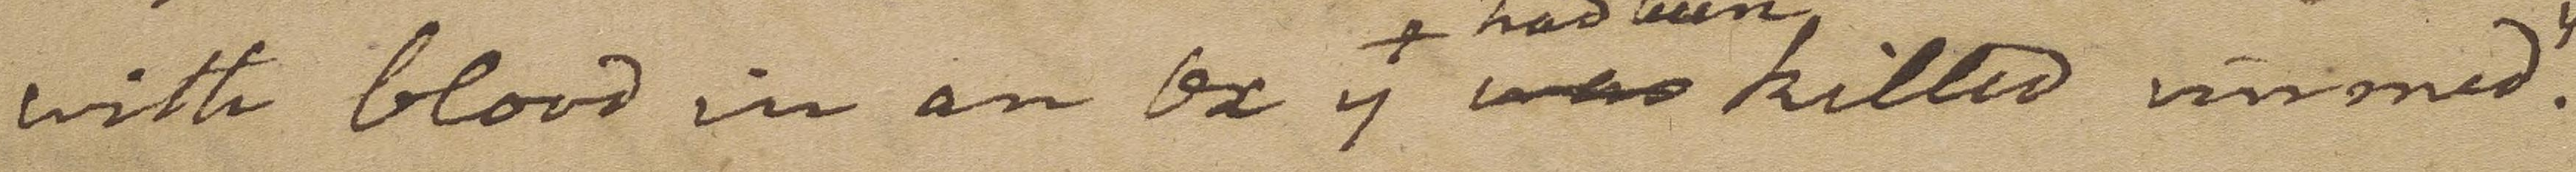with blood in an ox y^t [was] killed remed^y.
